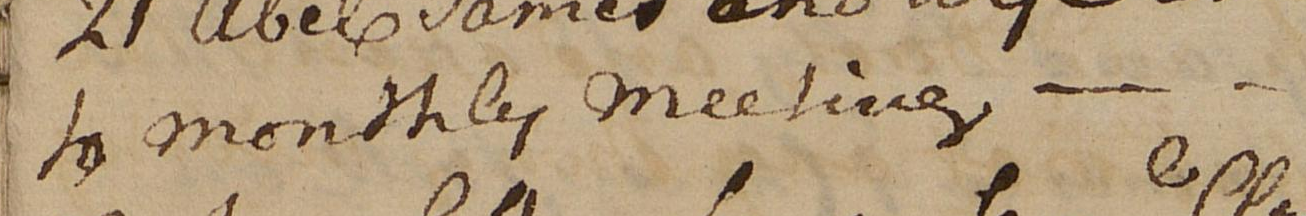to monthly meeting--
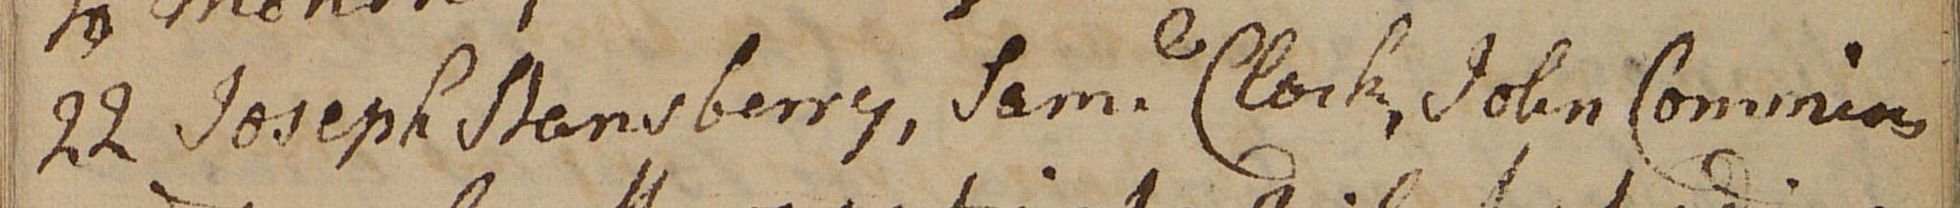22 Joseph Stansberry, Sam^l Clark, John Comminy
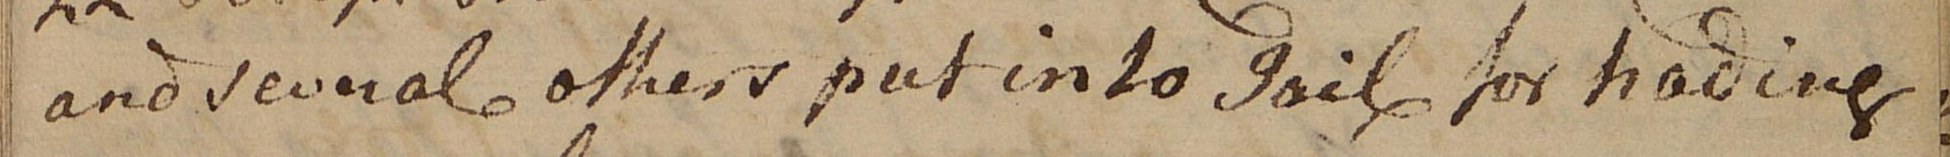and several others put in to Jail for hading
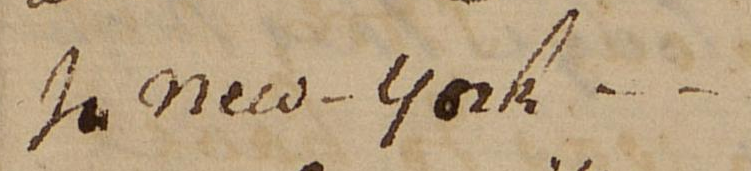to New- York--
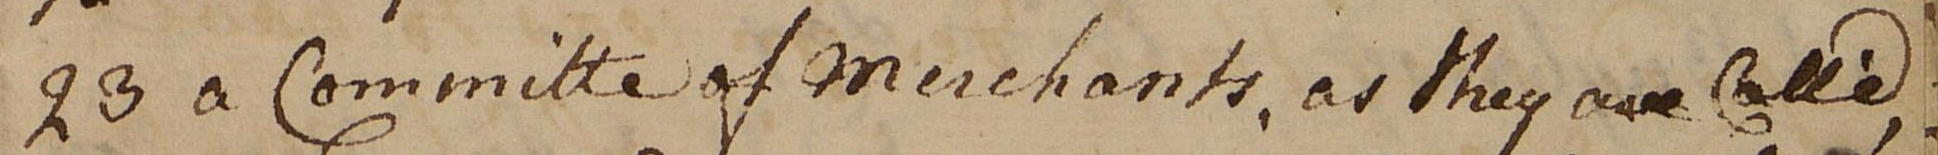23 a Committe of Merchants as they are call'd,
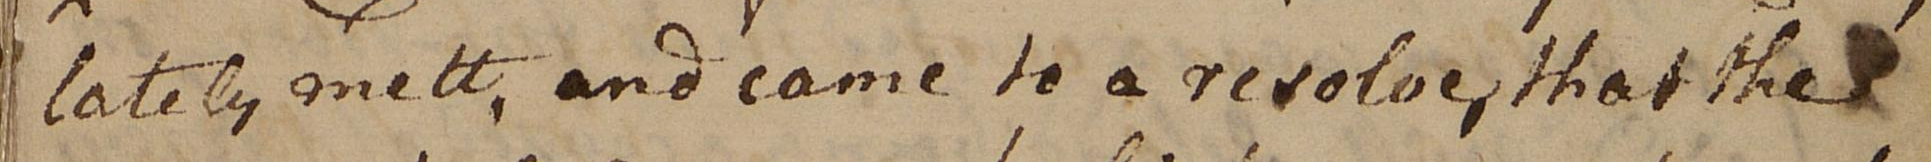lately mett, and came to a resolve, that the
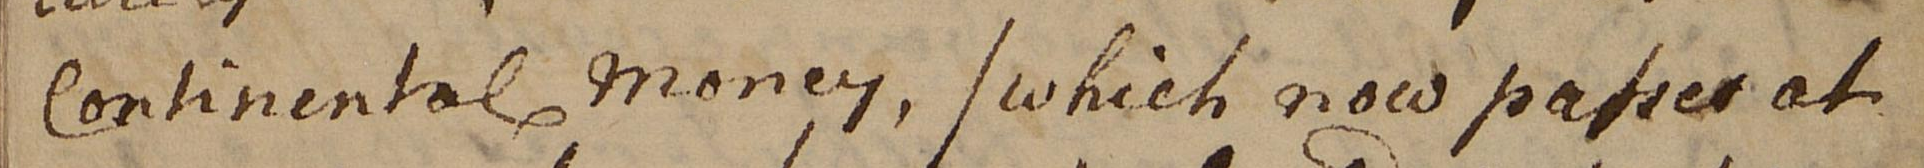Continental Money, /which now passes at
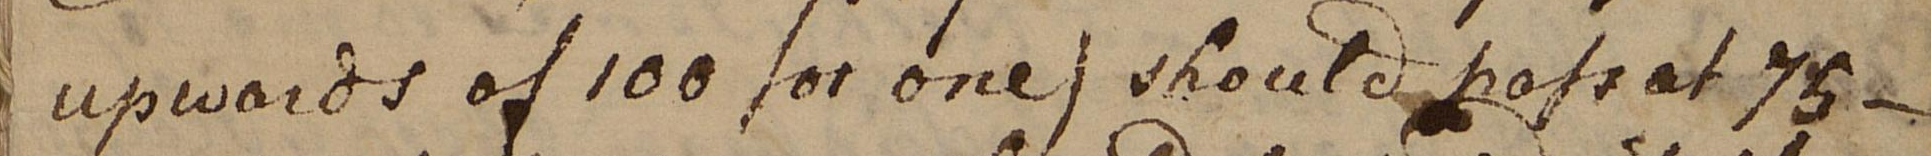upwards of 100 for one) should pass at 75-
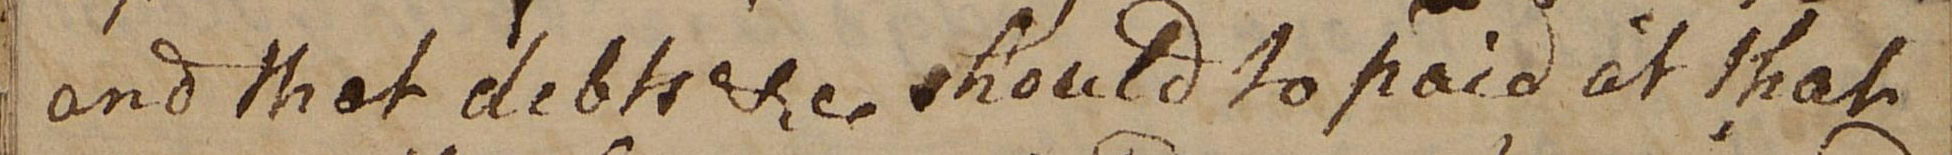and that debts &c should to paid at that
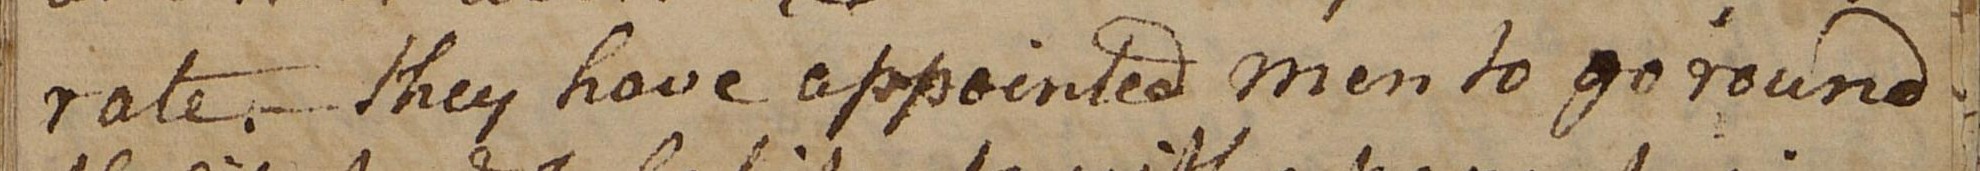rate.- they have appointed men to go round
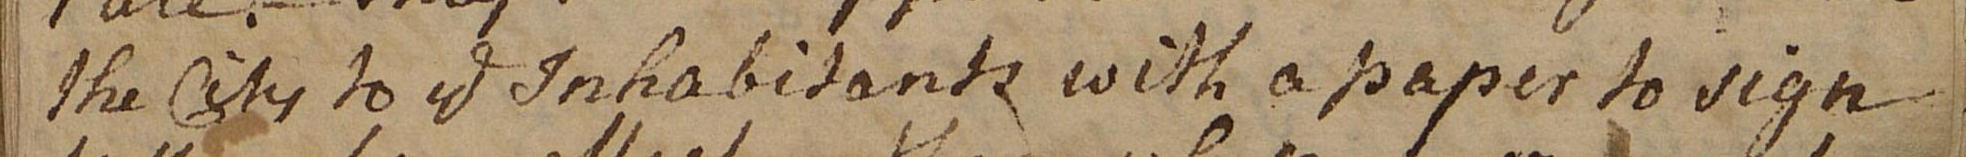the City to y^e Inhabitants with a paper to sign
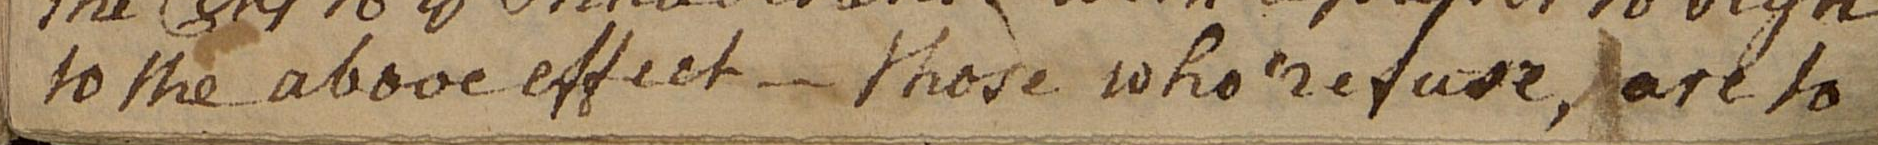to the above effect- those who refuse, are to
